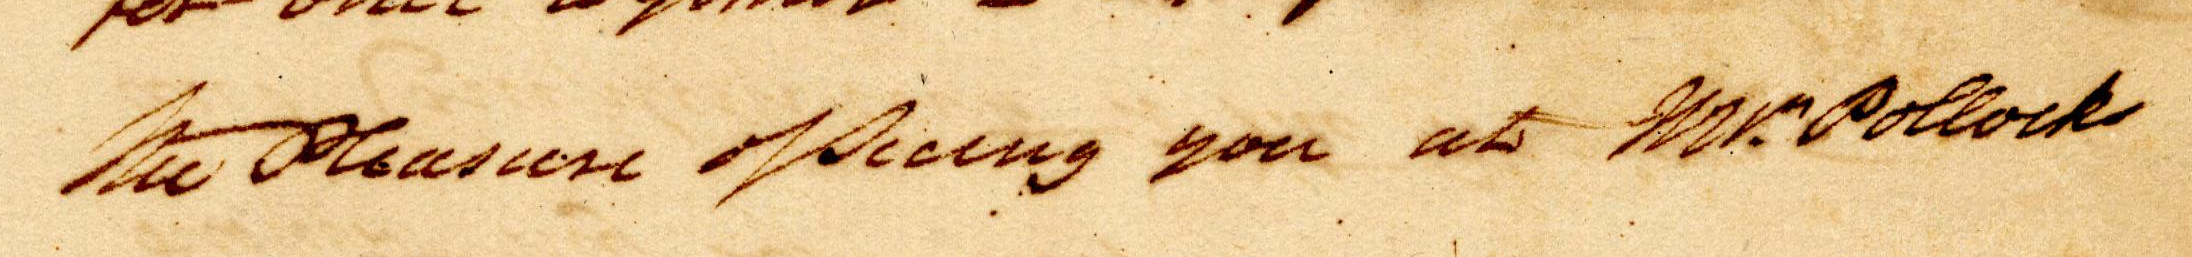the Pleasure of Seeing you at M^r. Pollocks
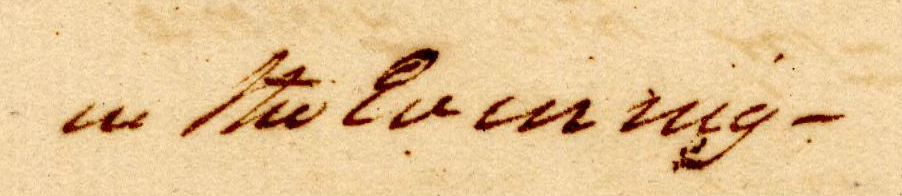in the Evening.
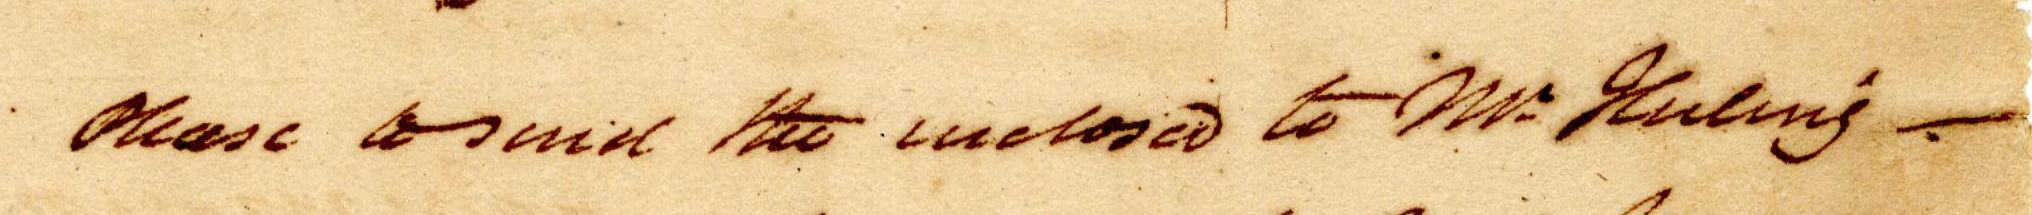Please & send the inclosed to M^r. Huling
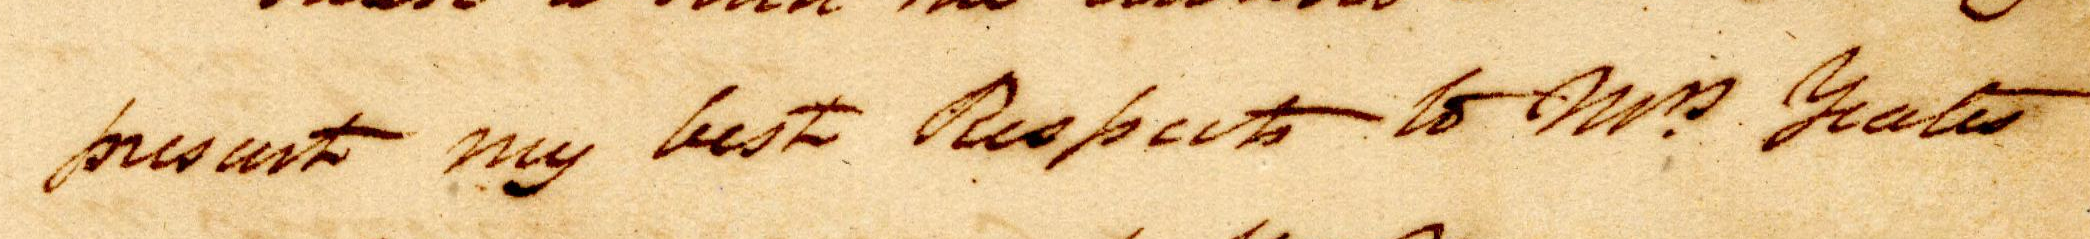present my best Respects to M^rs. Yeates
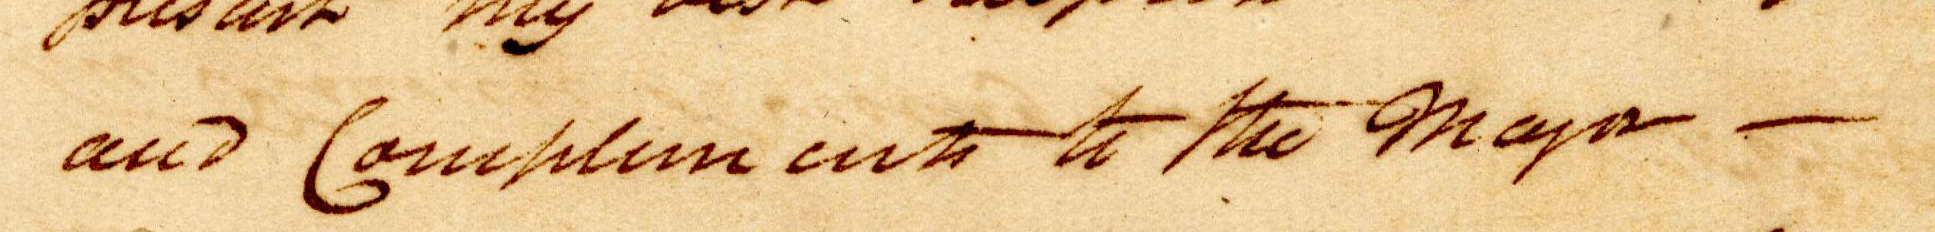and Compliments to the Major.
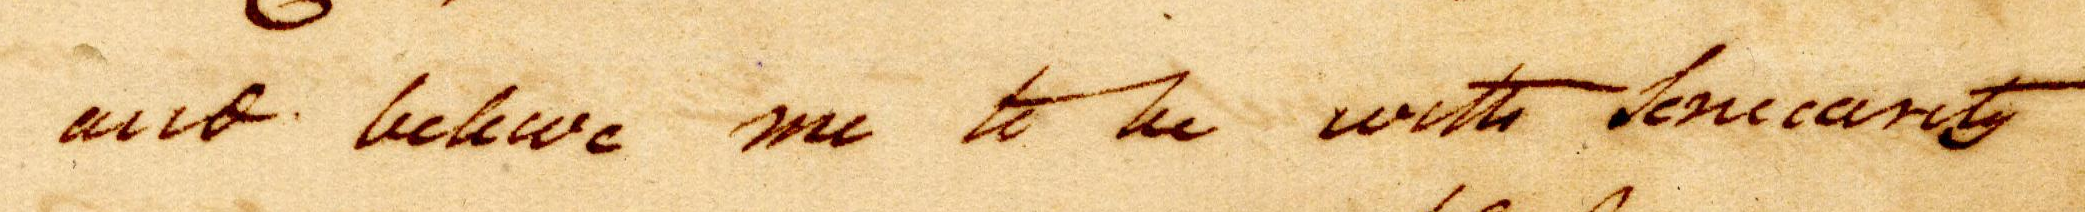and believe me to be with Sincearity
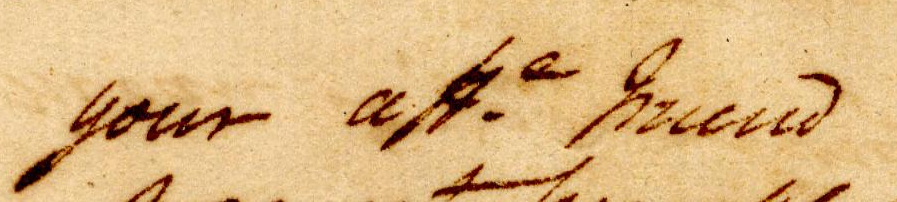your aff^e. friend
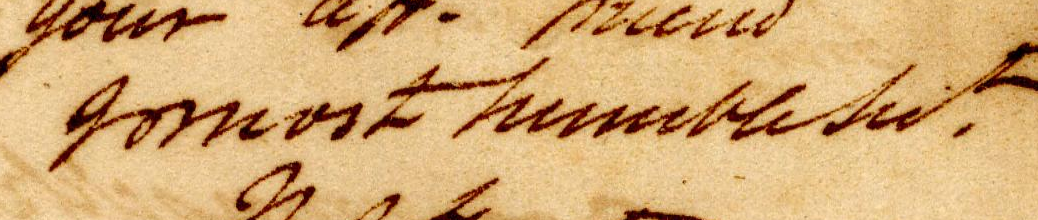& most humble ser^t.
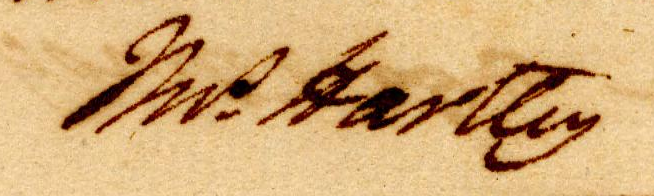Tho^s. Hartley
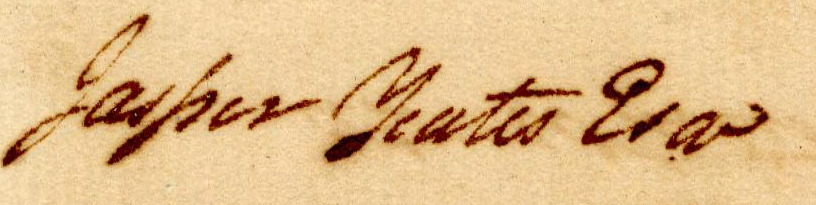Jasper Yeates Esq.
